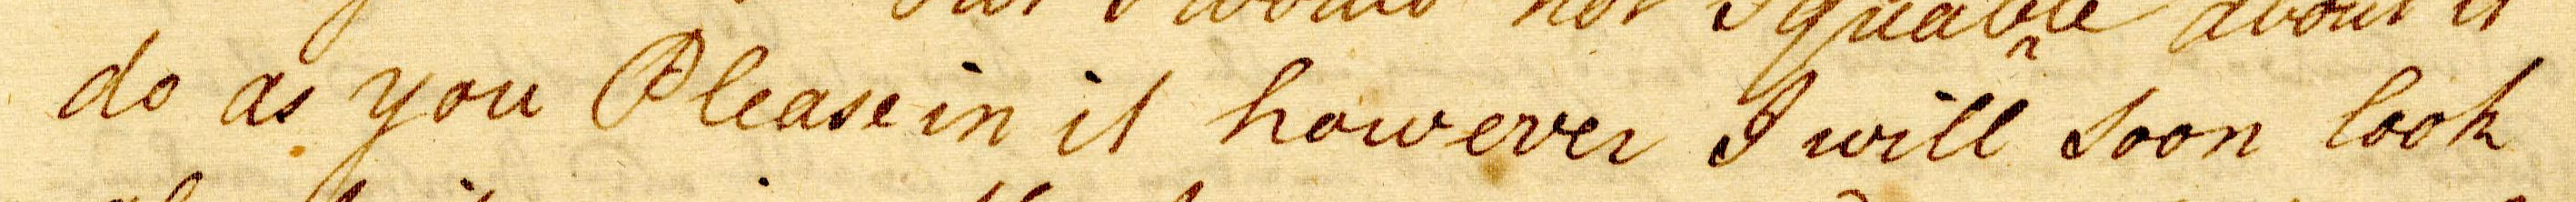do as you Please in it however I will soon look
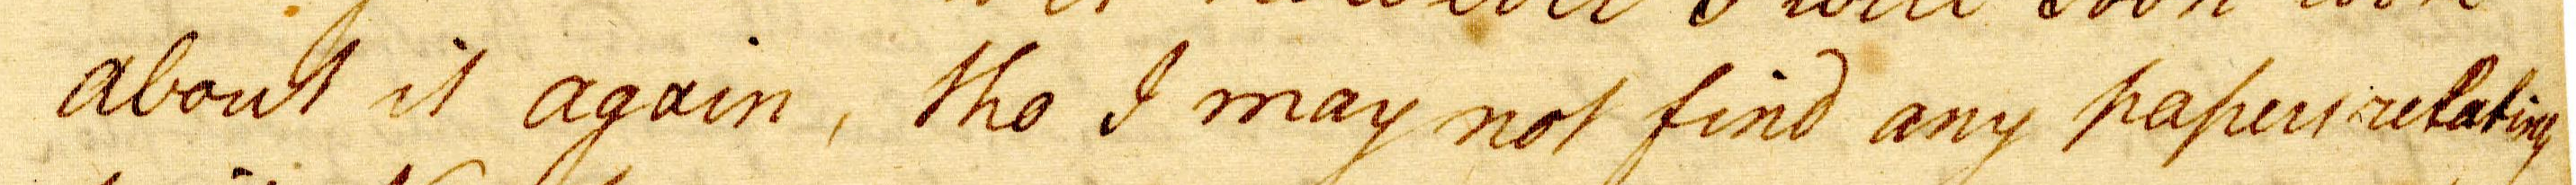about it again, tho I may not find any papers relating
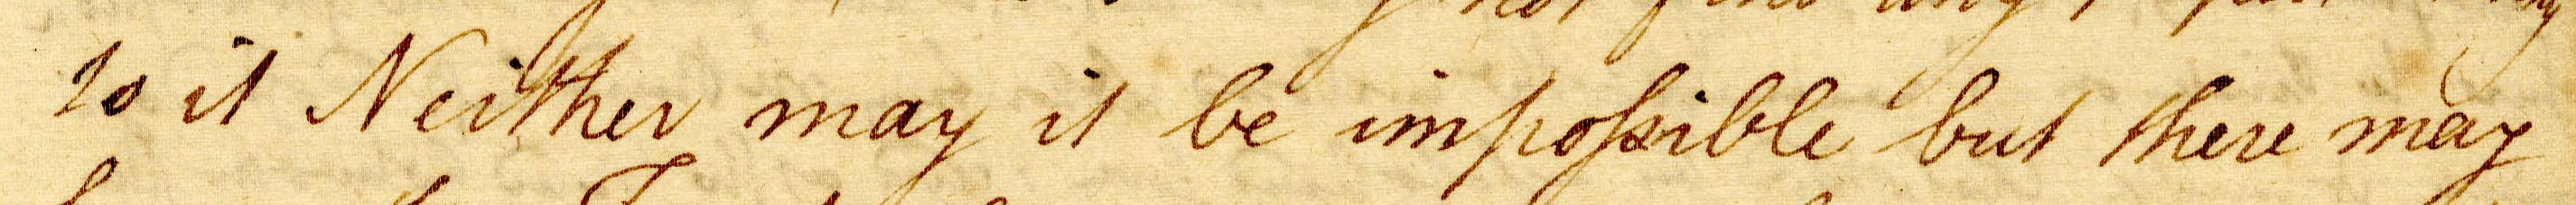to it Neither may it be impossible but there may
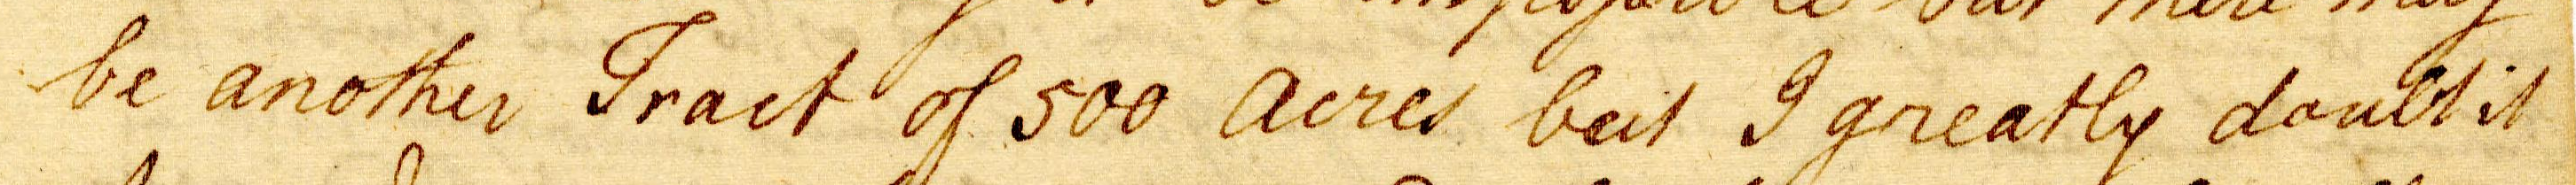be another Tract of 500 Acres but I greatly doubt it
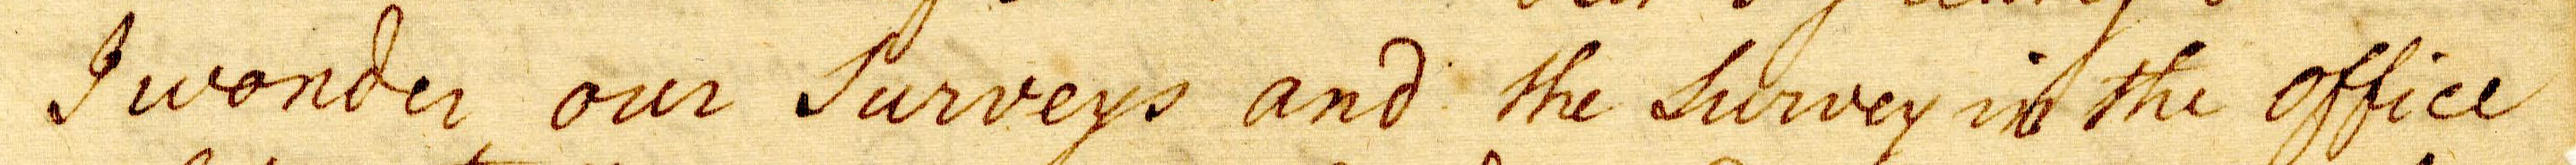I wonder our Surveys and the Survey in the Office
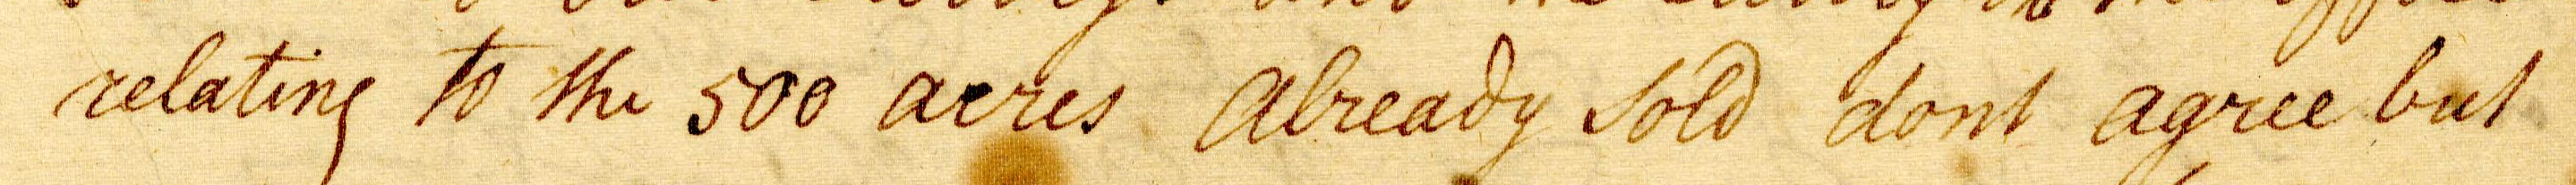relating to the 500 acres Already sold dont agree but
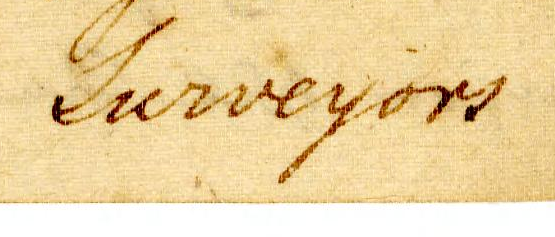Surveyors
